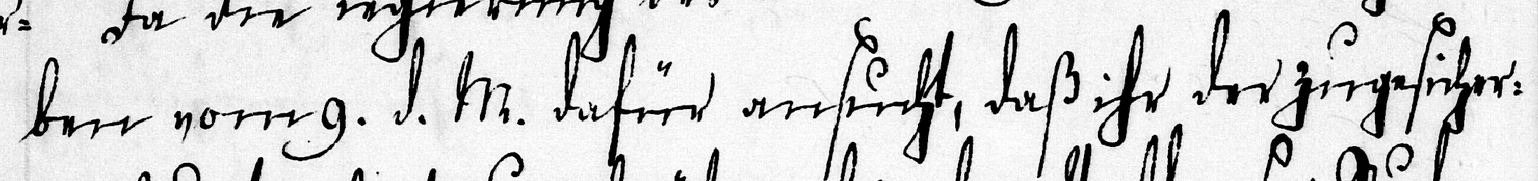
ben vom 9. d. M. dafür ansucht, daß ihr der zugesicher¬
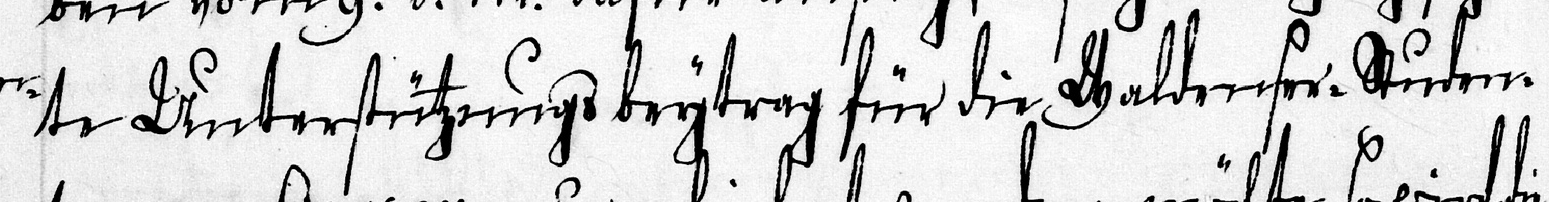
te Unterstützungsbeytrag für die Waldenser-Studen¬
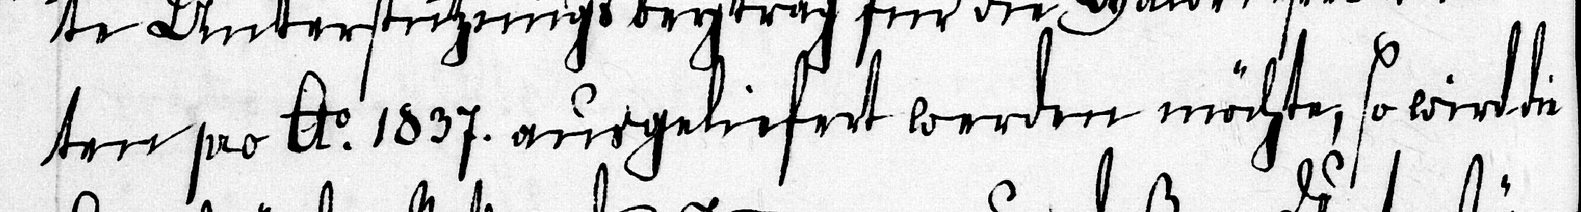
ten pro Ao. 1837. ausgeliefert werden möchte, so wird die
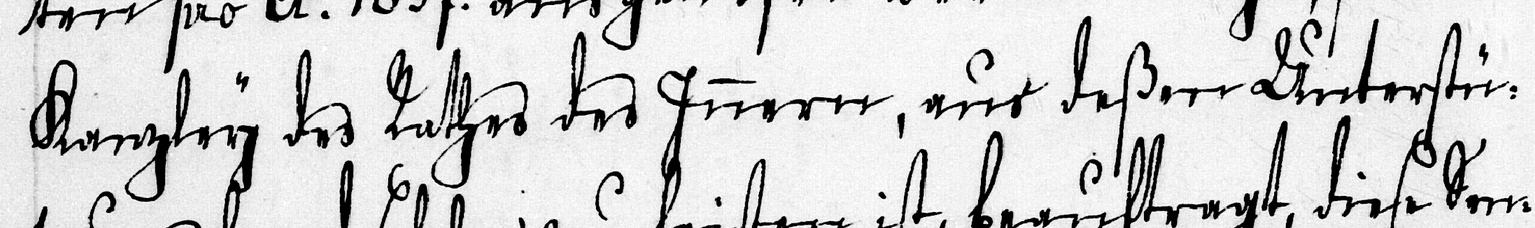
Kanzley des Rathes des Innern, aus deßen Unterstü¬
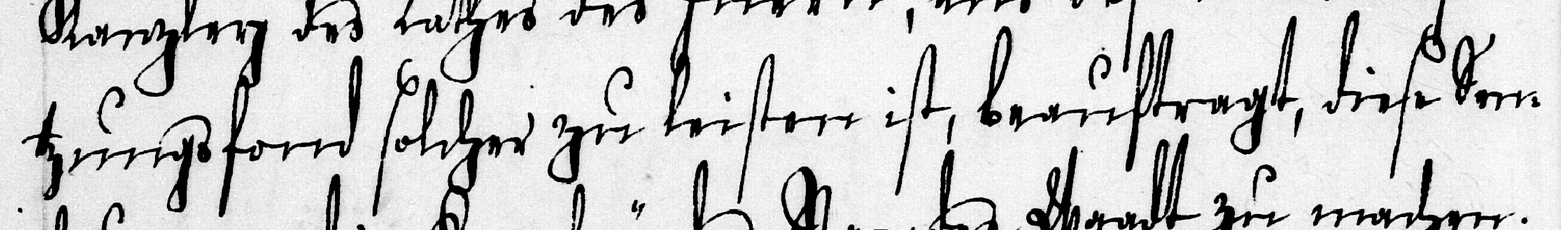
tzungsfond solcher zu leisten ist, beauftragt, diese Se¬
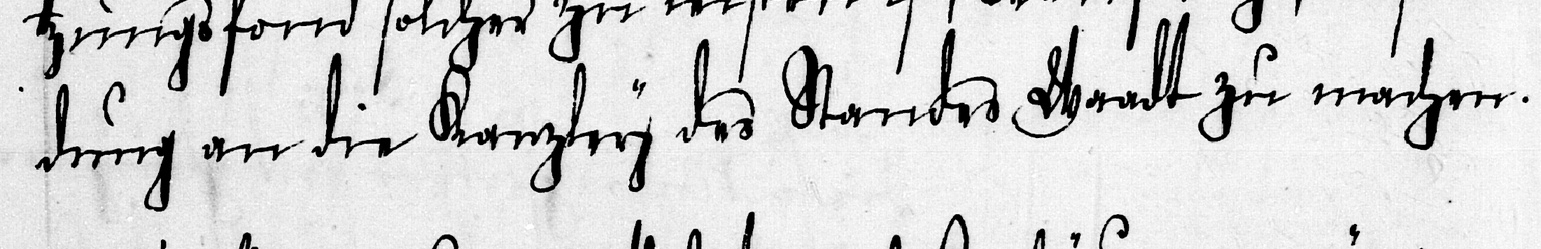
ndung an die Kanzley des Standes Waadt zu machen.
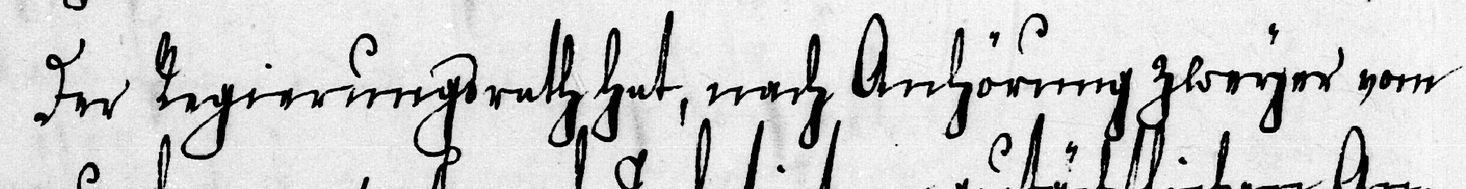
Der Regierungsrath hat, nach Anhörung zweyer vom
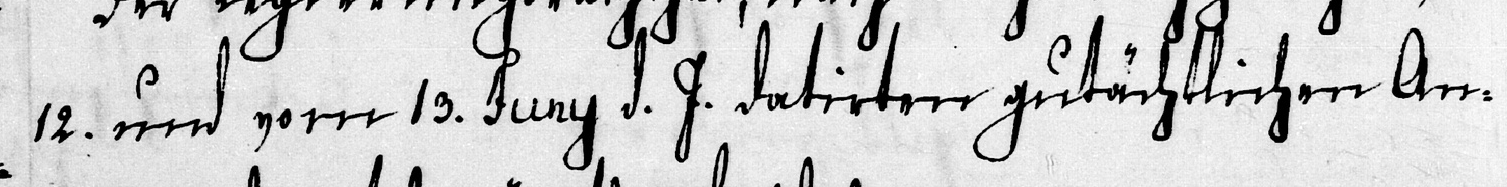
12. und vom 13. Juny d. J. datirten gutächtlichen An¬
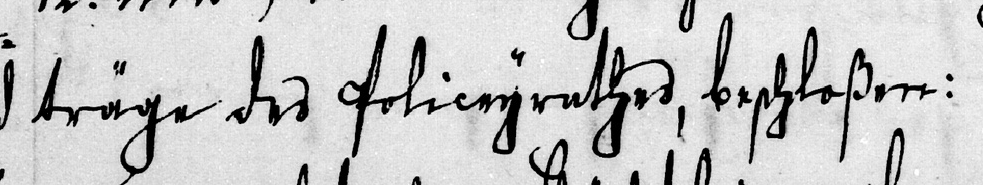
träge des Policeyrathes, beschloßen:
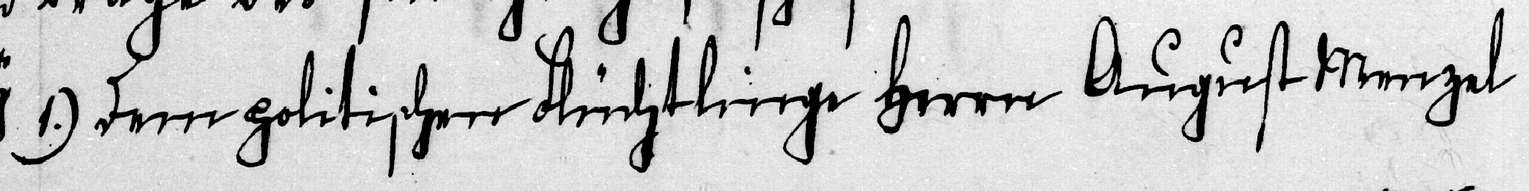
1.) Dem politischen Flüchtlinge Herrn August Menzel
